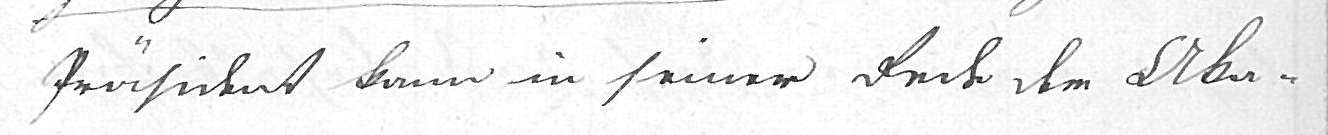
Präsident kann in seiner Rede der Aka-
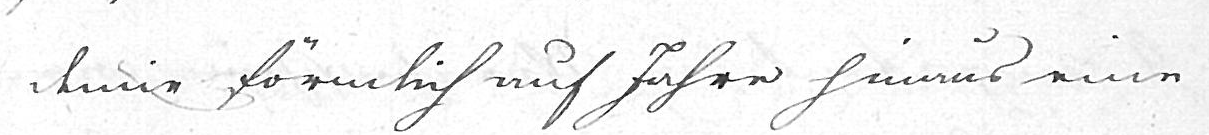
demie förmlich auf Jahre hinaus eine
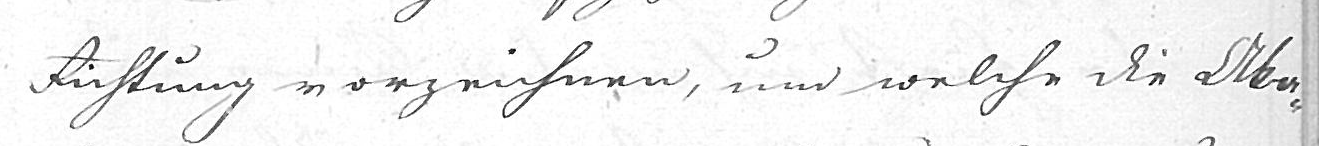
Richtung vorzeichnen, um welche die Aka-
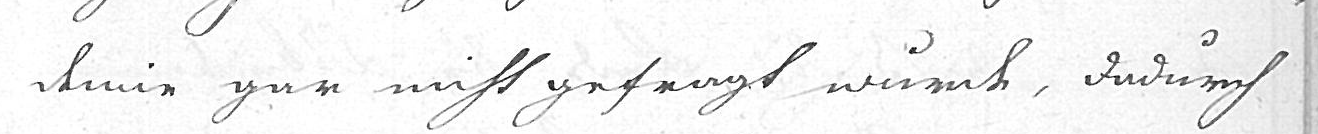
demie gar nicht gefragt wurde, dadurch
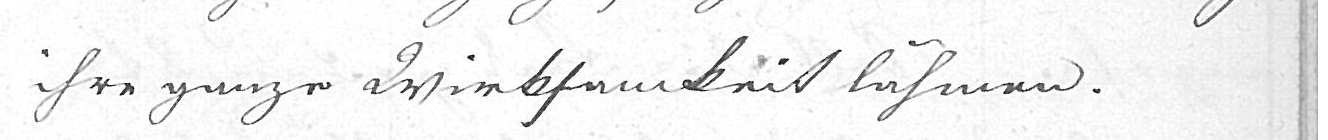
ihre ganze Wirksamkeit lähmen.
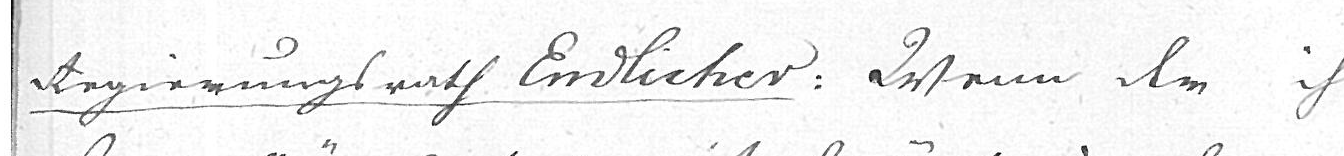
Regierngsrath Endlicher: Wenn der
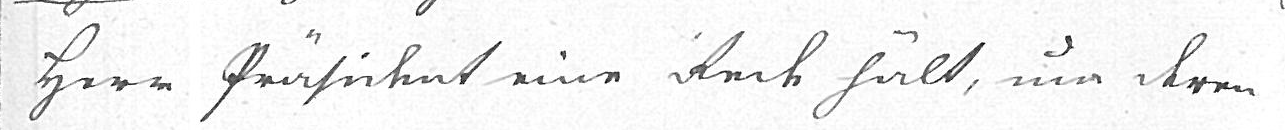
Herr Präsident eine Rede hält, um deren
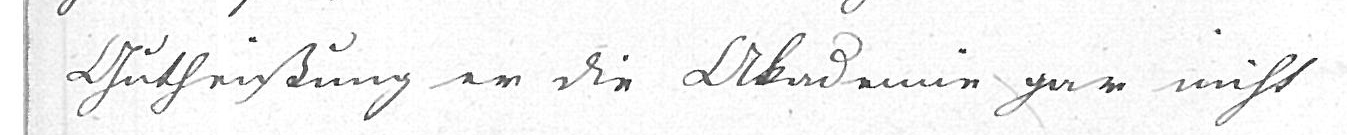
Gutheißung er die Akademie gar nicht
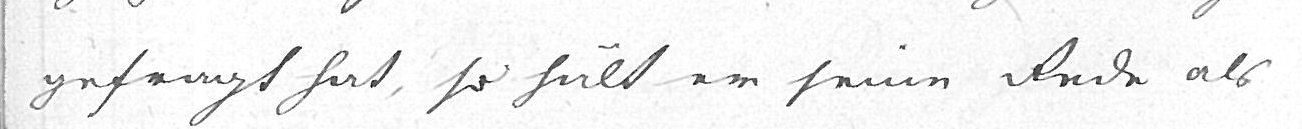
gefragt hat, so hält er seine Rede als
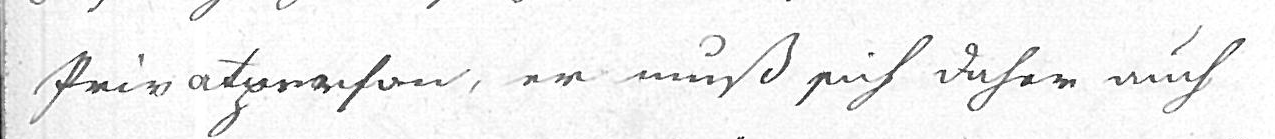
Privatperson, er muß sich daher auch
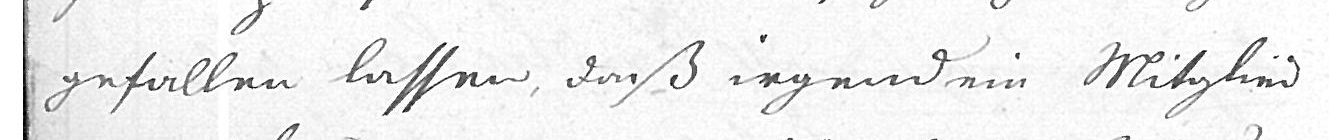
gefallen lassen, daß irgendein Mitglied
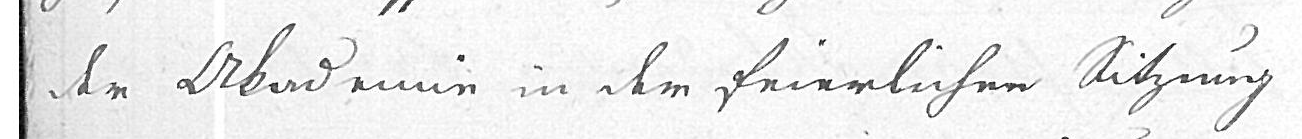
der Akademie in der feierlichen Sitzung
